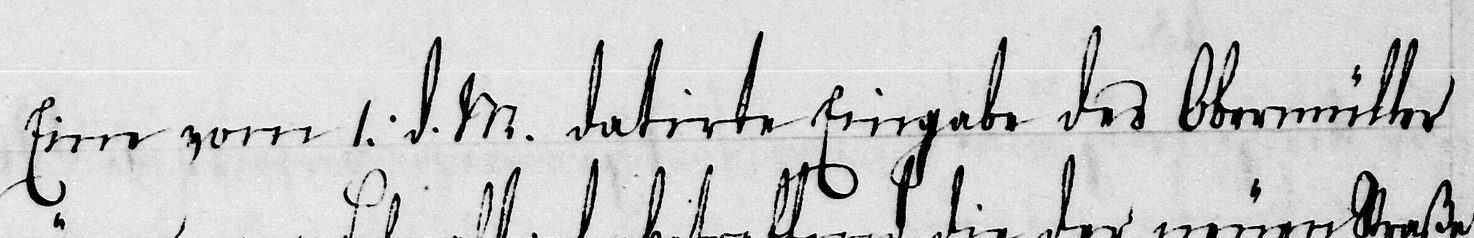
Eine vom 1. d. M. datirte Eingabe des Obermüller
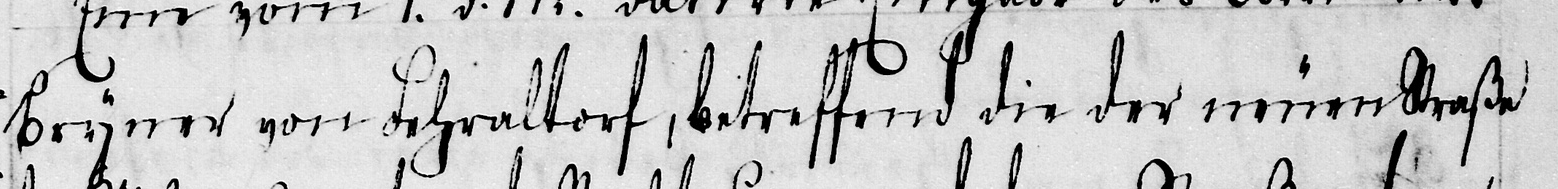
Bryner von Fehraltorf, betreffend die der neuen Straße
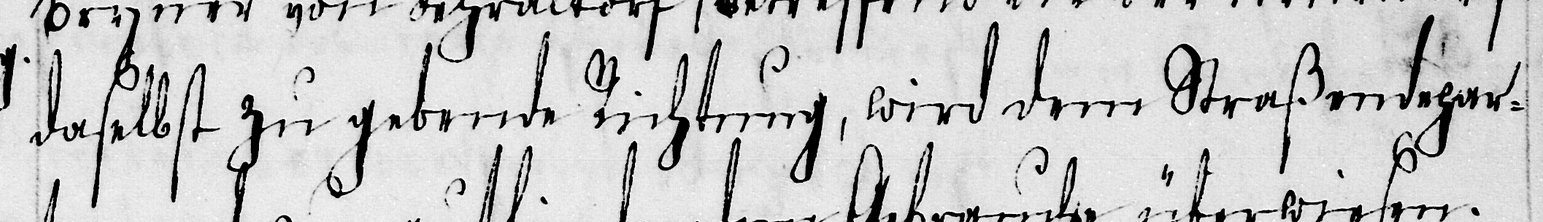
daselbst zu gebende Richtung, wird dem Straßendepar¬
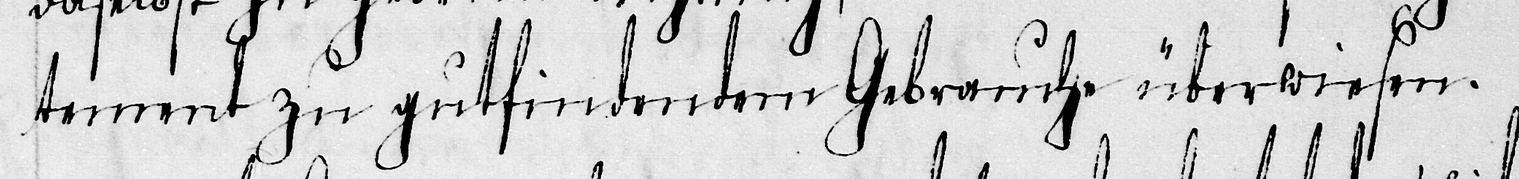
tement zu gutfindendem Gebrauche überwiesen.
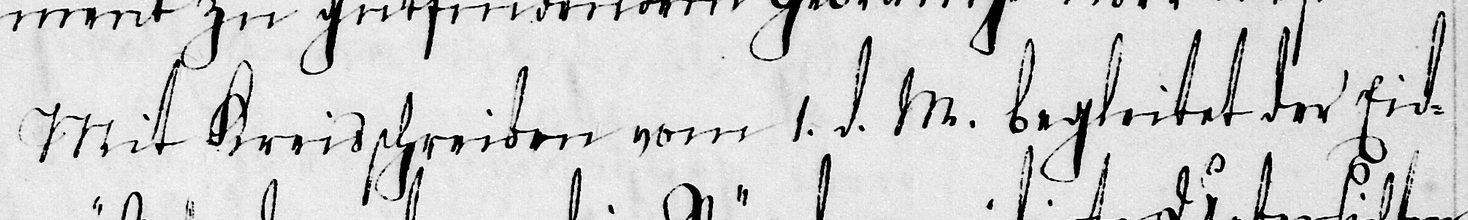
Mit Kreisschreiben vom 1. d. M. begleitet der Eid¬
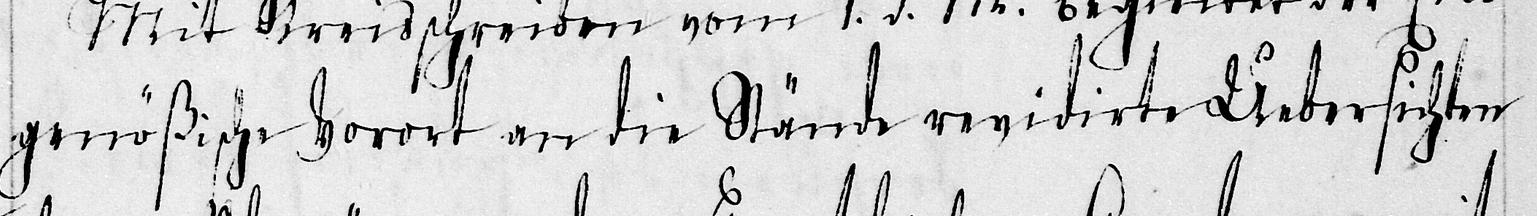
genößische Vorort an die Stände revidirte Uebersichten
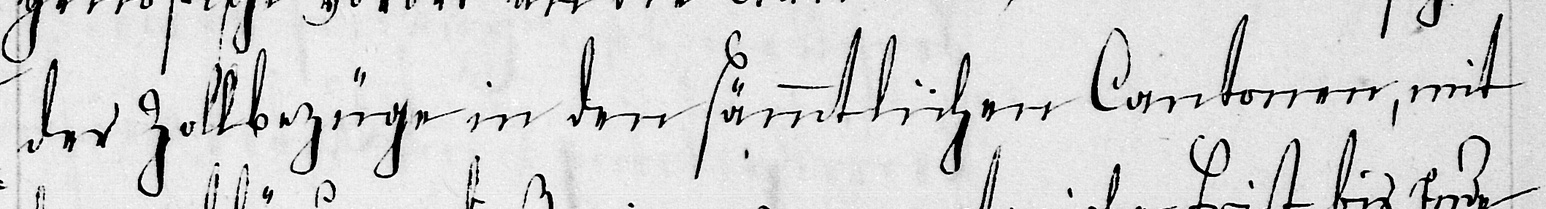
der Zollbezüge in den sämmtlichen Cantonen, mit
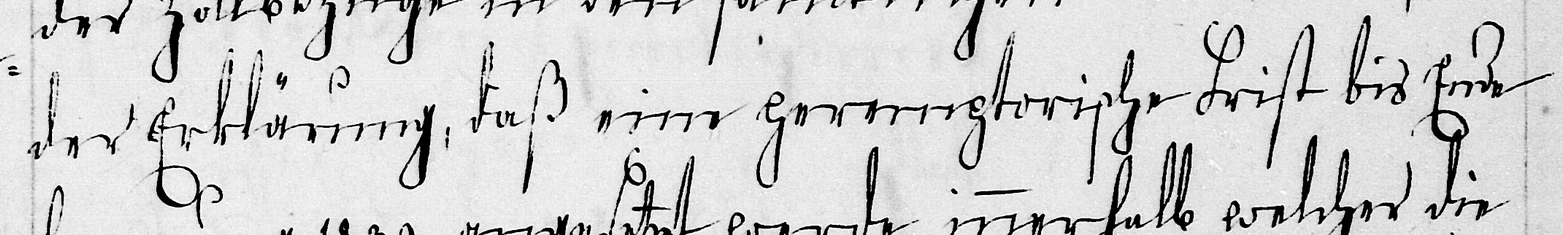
der Erklärung, daß eine peremptorische Frist bis Ende
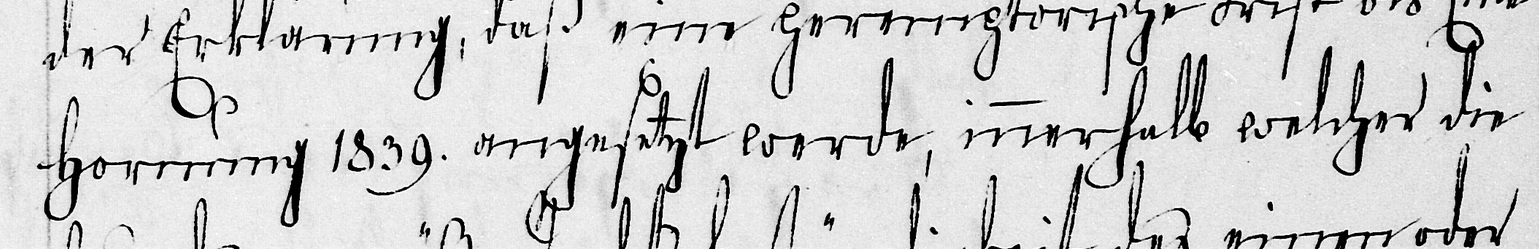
Hornung 1839. angesetzt werde, innerhalb welcher die
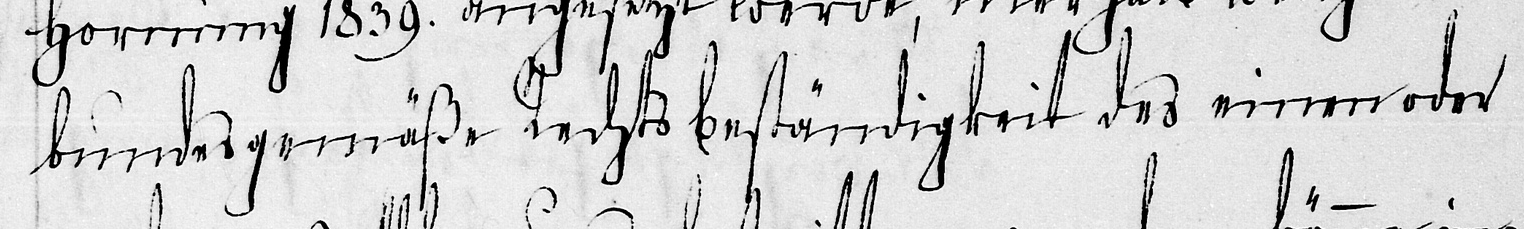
bundesgemäße Rechtsbeständigkeit des einen oder
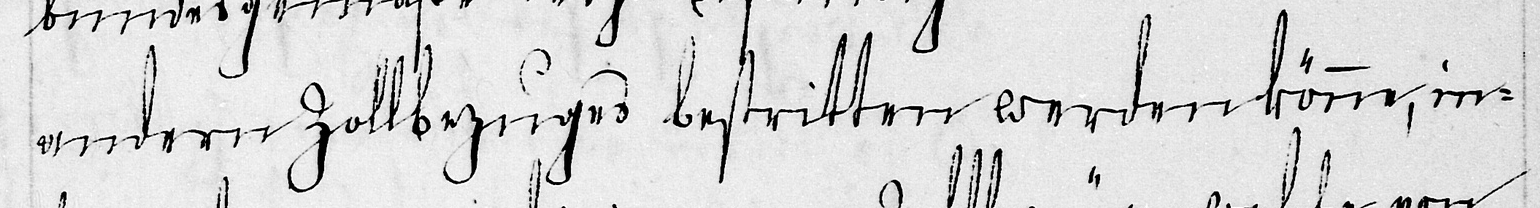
andern Zollbezuges bestritten werden könne, in¬
